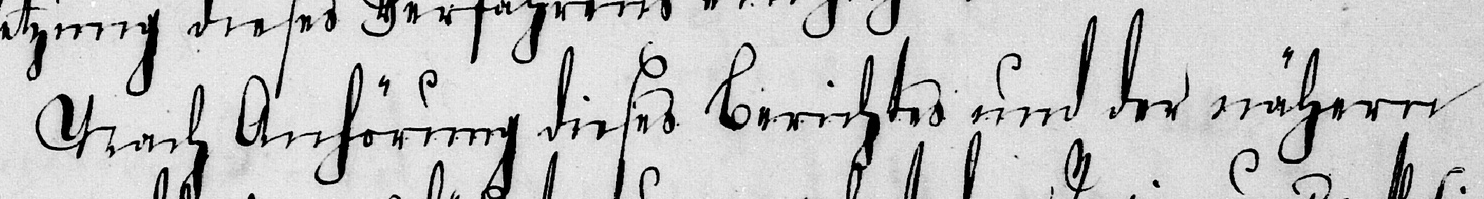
Nach Anhörung dieses Berichts und der nähern
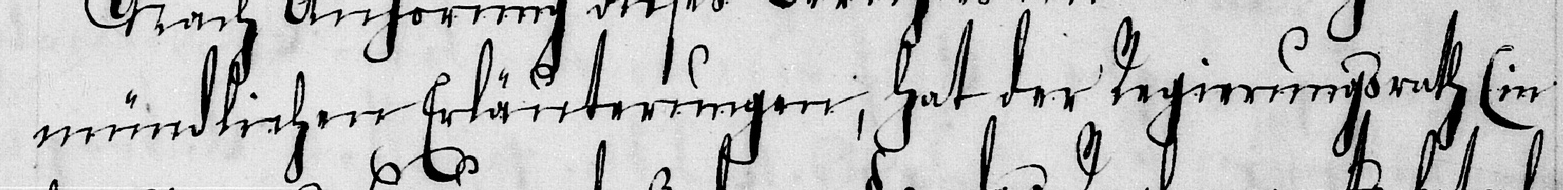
mündlichen Erläuterungen, hat der Regierungsrath (in
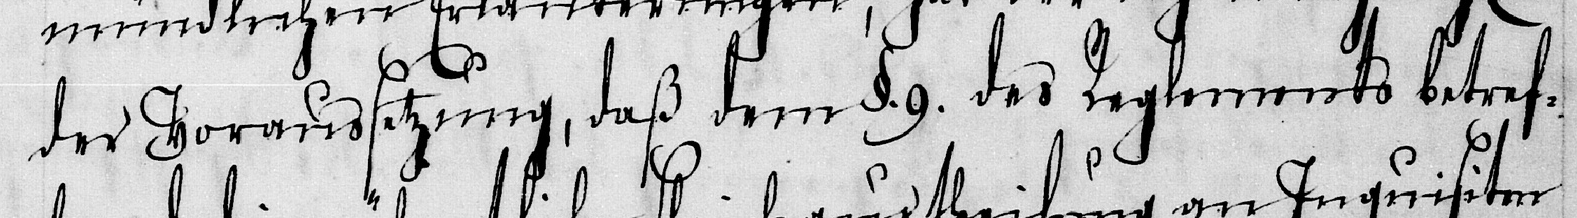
der Voraussetzung, daß dem §. 9. des Reglements betref¬
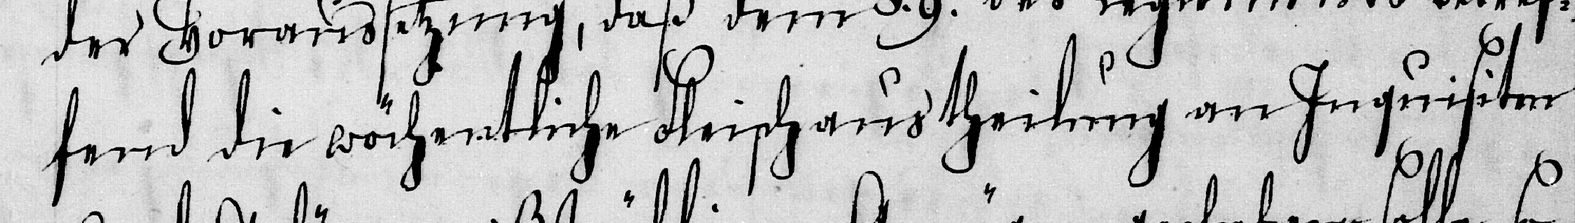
fend die wöchentliche Fleischaustheilung an Inquisiten
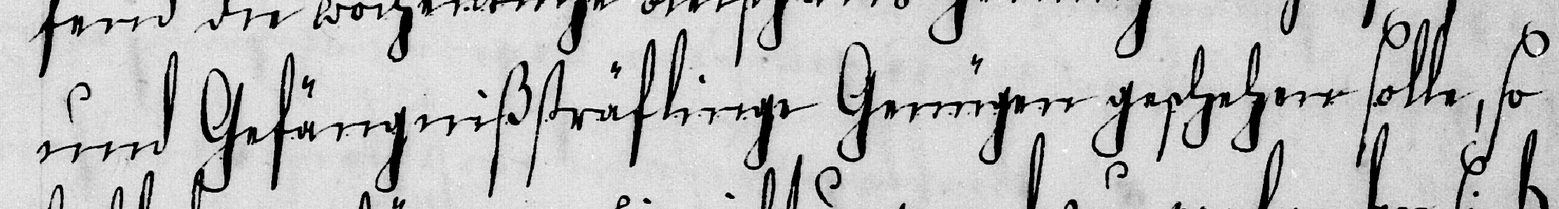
und Gefängnißsträflinge Genügen geschehen solle,
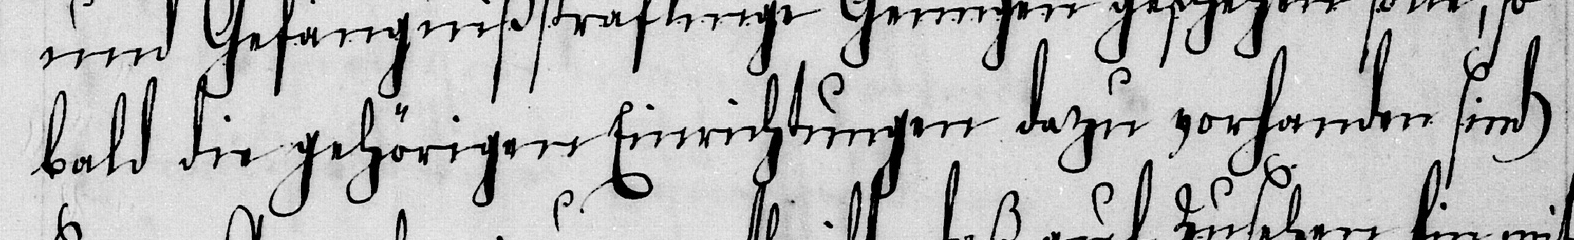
bald die gehörigen Einrichtungen dazu vorhanden sind)
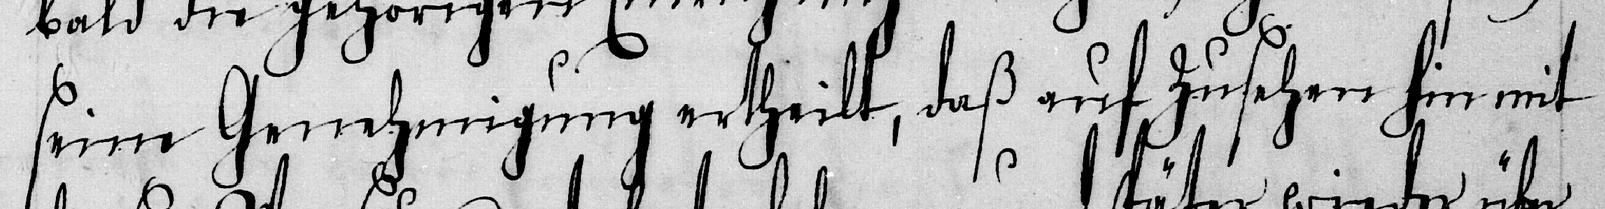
seine Genehmigung ertheilt, daß auf Zusehen hin mit
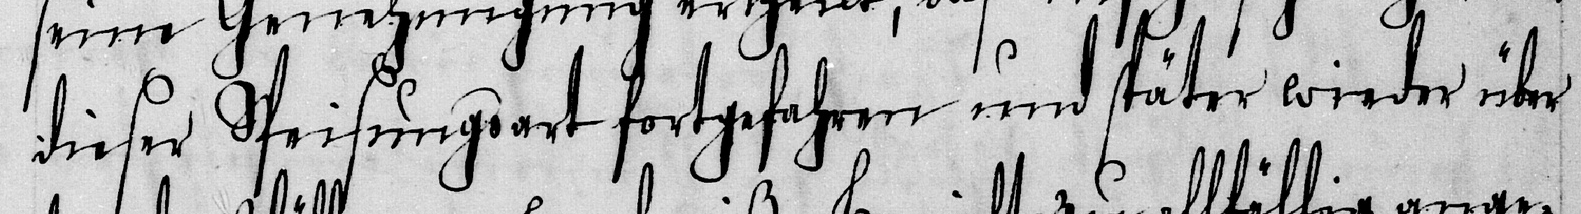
dieser Speisungsart fortgefahren und später wieder über
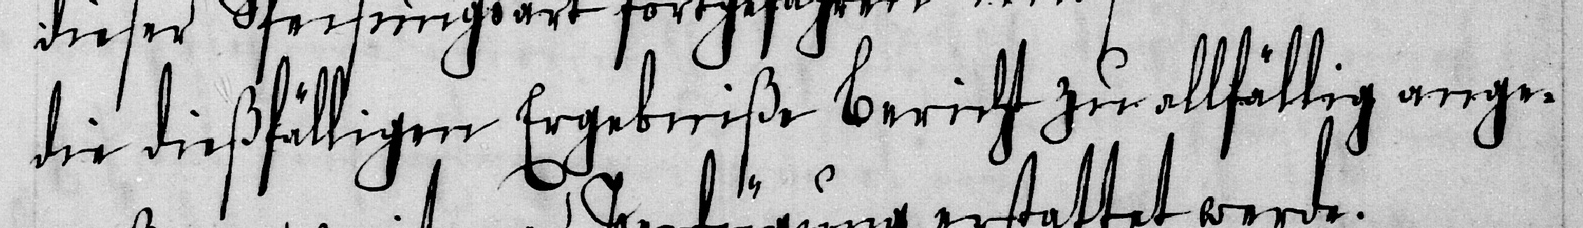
die dießfälligen Ergebniße Bericht zu allfällig ange¬
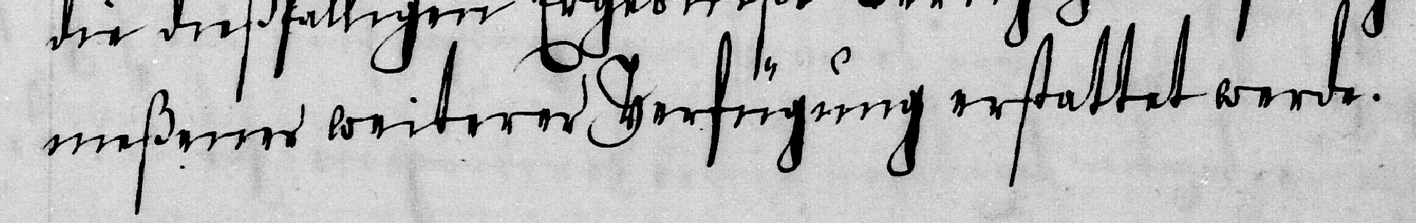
meßener weiteren Verfügung erstattet werde.
